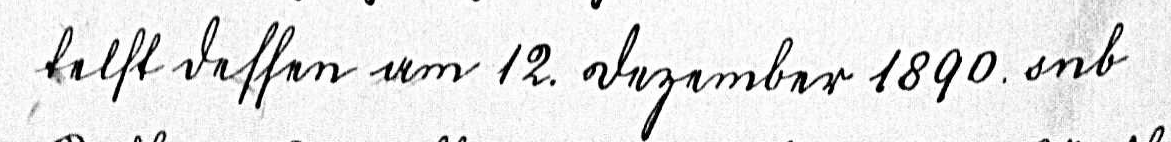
telst dessen am 12. Dezember 1890 sub
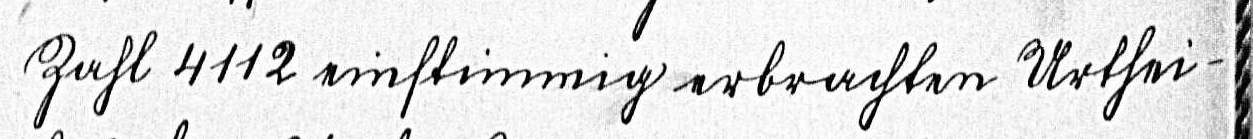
Zahl 4112 einstimmig erbrachten Urthei¬
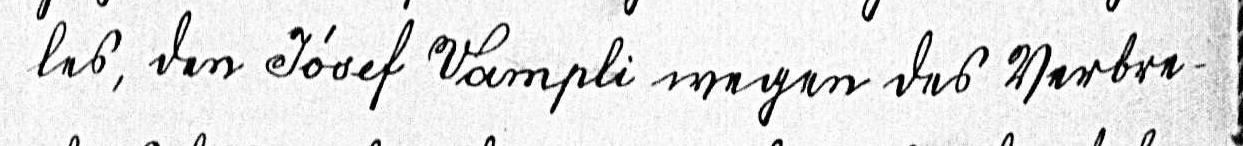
les, den Jósef Vampli wegen des Verbre¬
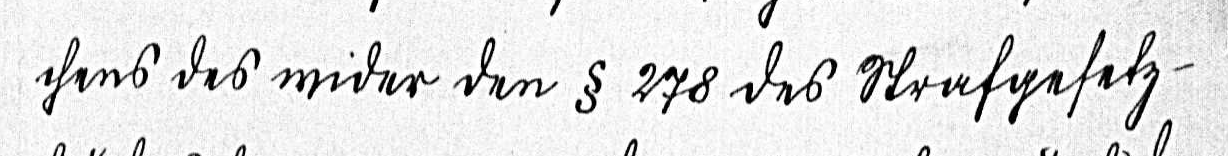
chens des wider den §278 des Strafgesetz¬
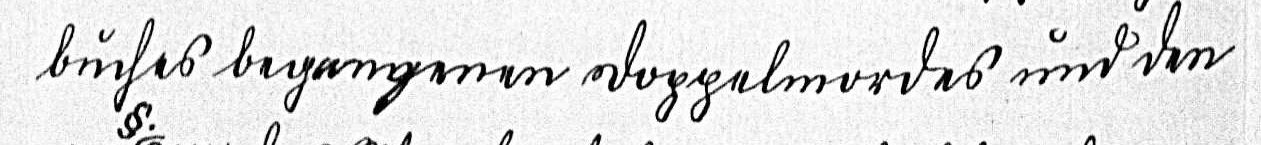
buches begangenen Doppelmordes und den
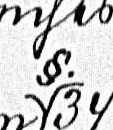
§.
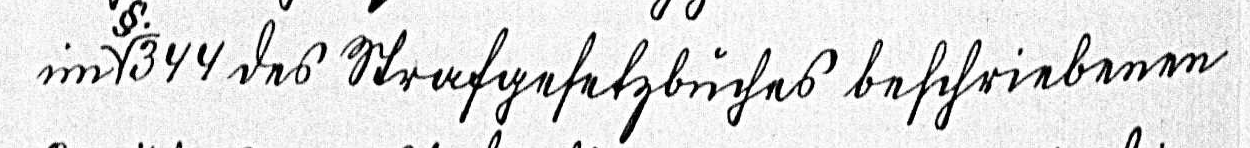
im 344 Strafgesetzbuches beschriebenen
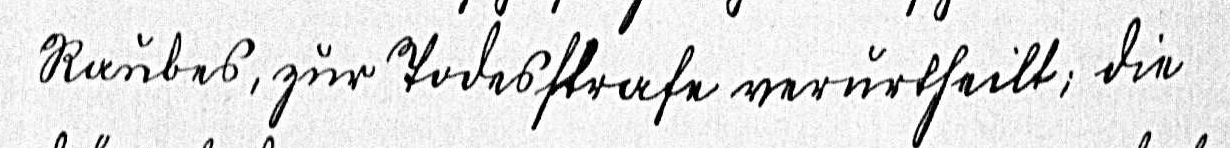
Raubes, zur Todesstrafe verurtheilt; die
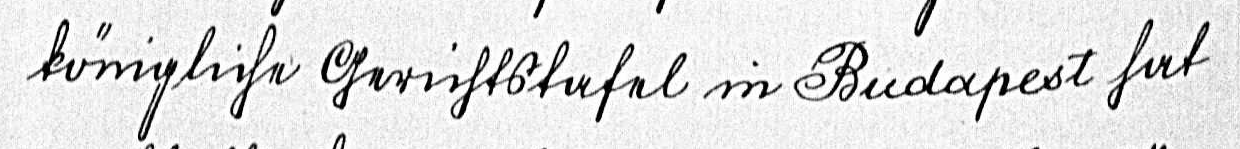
königliche Gerichtstafel in Budapest hat
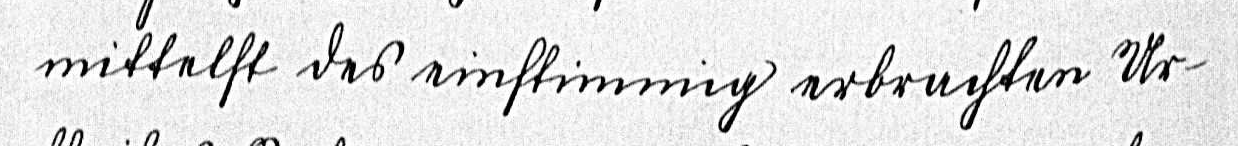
mittelst des einstimmig erbrachten Ur¬
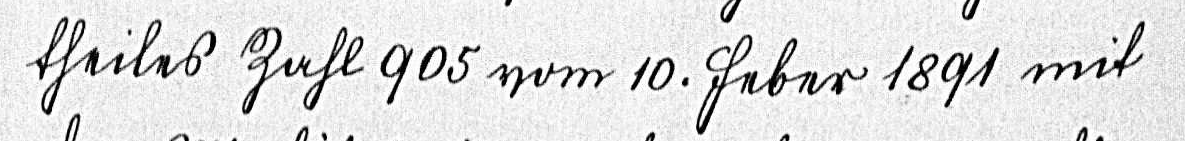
theiles Zahl 905 vom 10. Feber 1891 mit
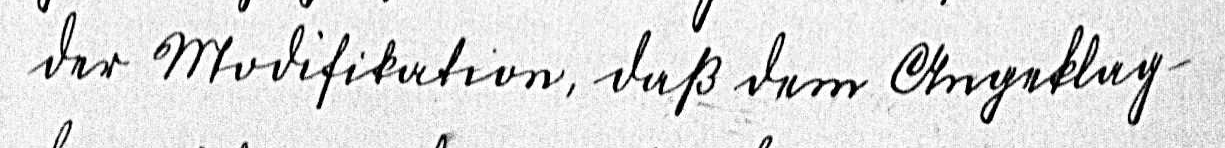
der Modifikation, daß dem Angeklag¬
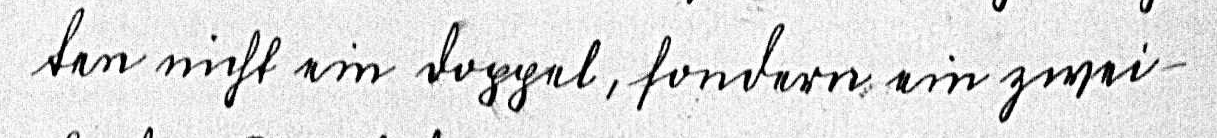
ten nicht ein doppel, sondern ein zwei¬
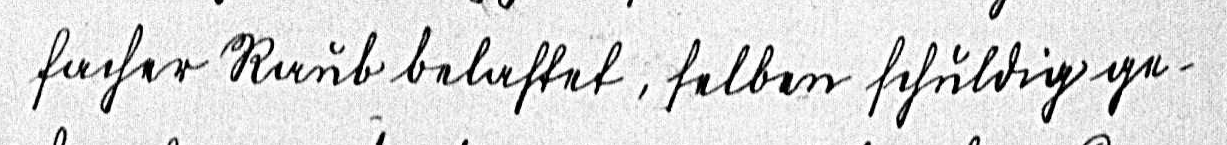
facher Raub belastet, selben schuldig ge¬
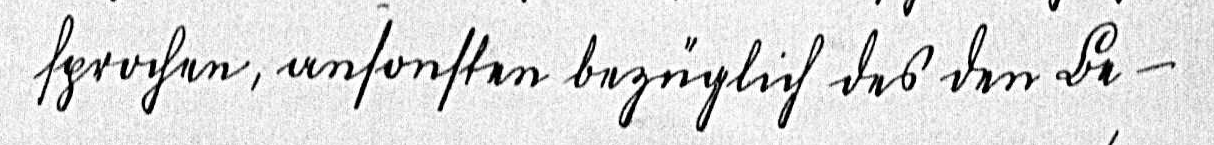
sprochen, ansonsten bezüglich des den Be¬
